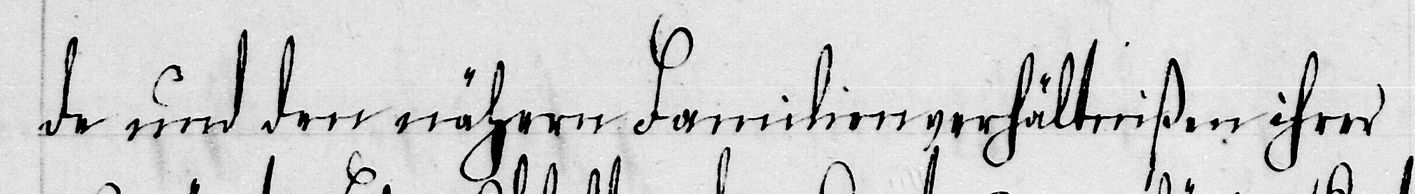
de und den nähern Familienverhältnißen ihrer
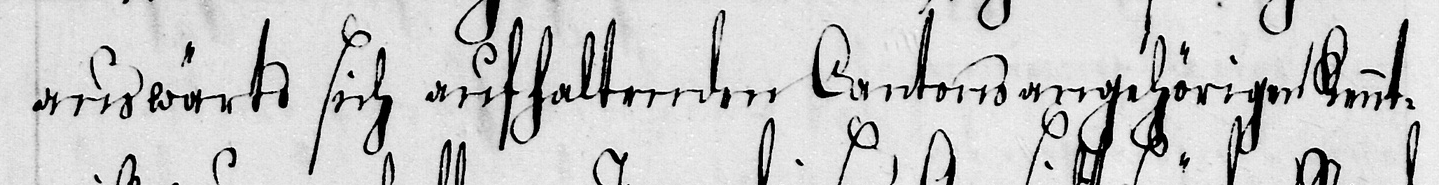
auswärts sich aufhaltenden Cantonsangehörigen Kenn¬
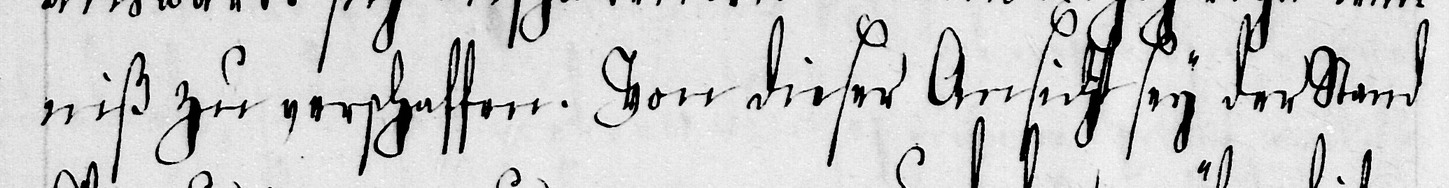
tniß zu verschaffen. Von dieser Ansicht sey der Stand
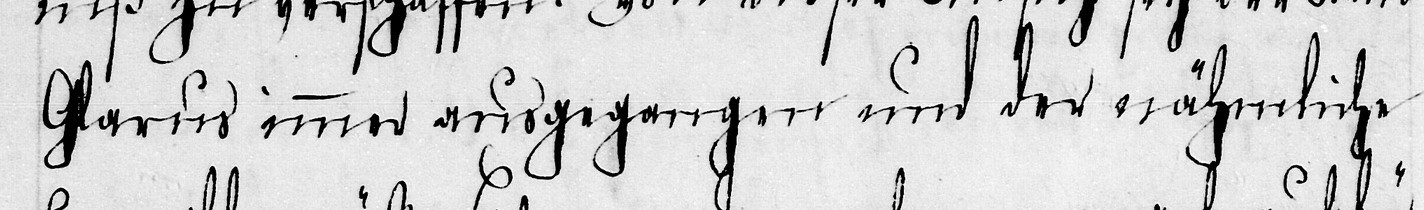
Glarus immer ausgegangen und der nähmliche
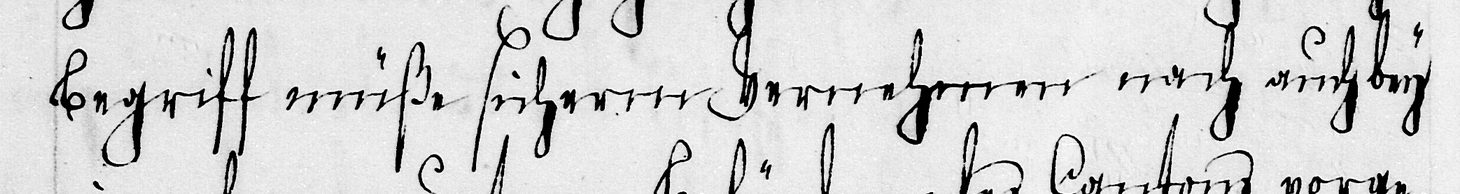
Begriff müße sicherm Vernehmen nach auch bey
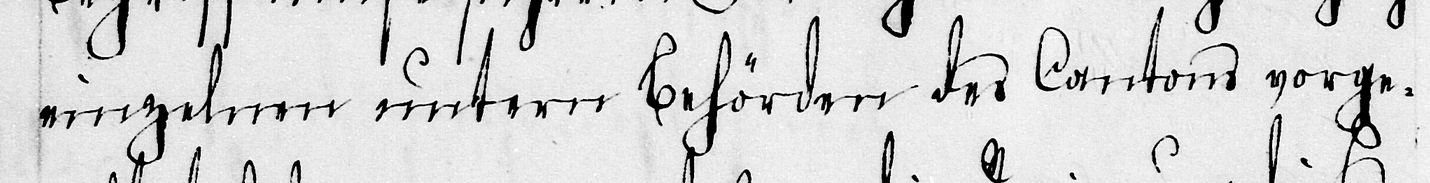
einzelnen untern Behörden des Cantons vorge¬
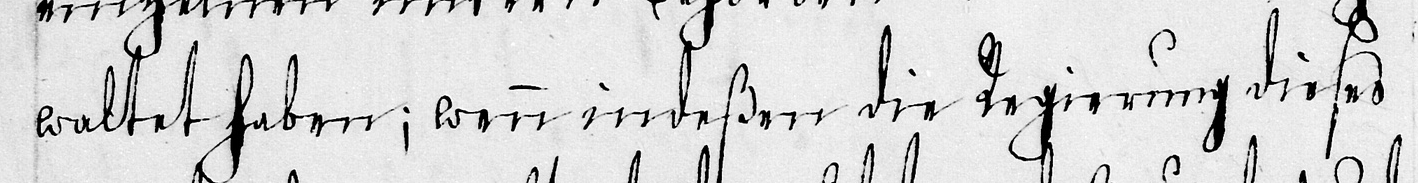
waltet haben; wenn indeßen die Regierung dieses
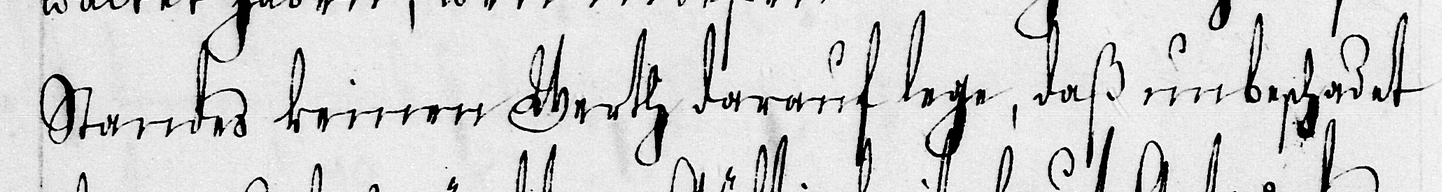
Standes keinen Werth darauf lege, daß unbeschadet
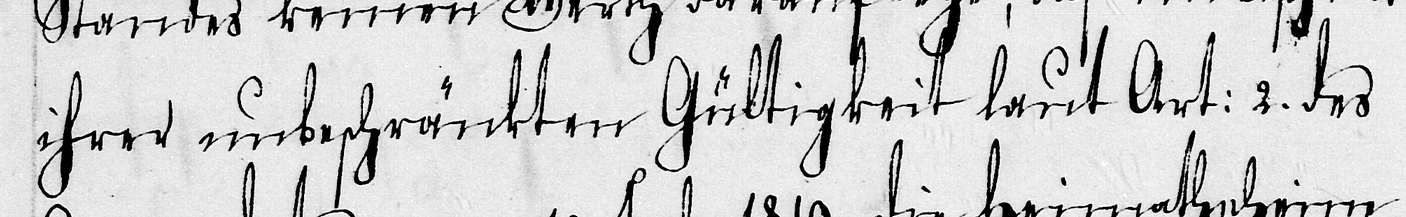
ihrer unbeschränkten Gültigkeit laut Art: 2. des
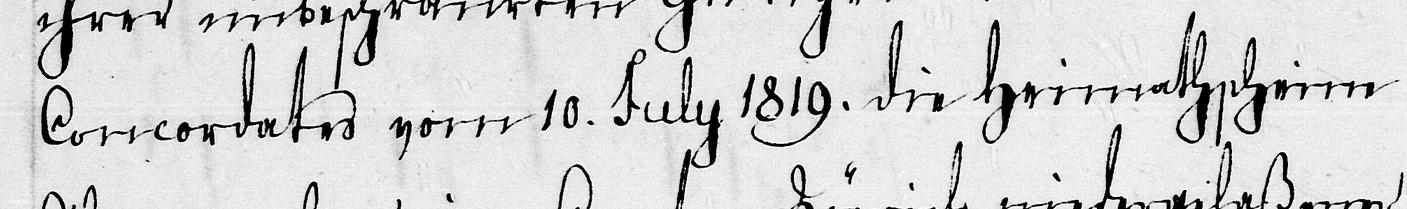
Concordates vom 10. July 1819. die Heimathscheine
